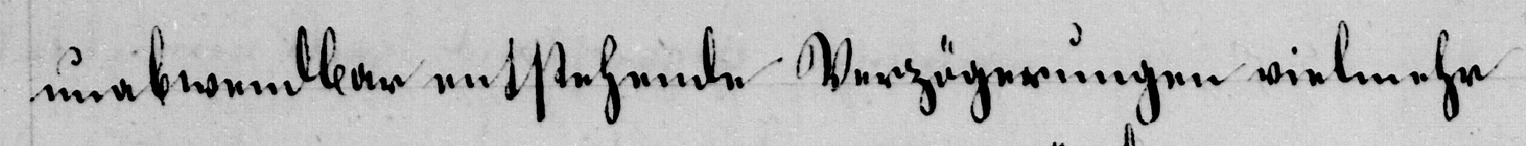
unabwendbar entstehende Verzögerungen vielmehr
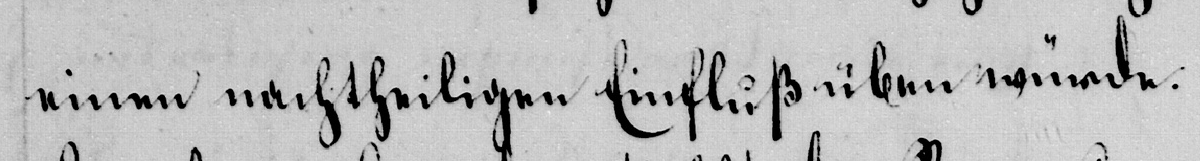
einen nachtheiligen Einfluß üben würde.
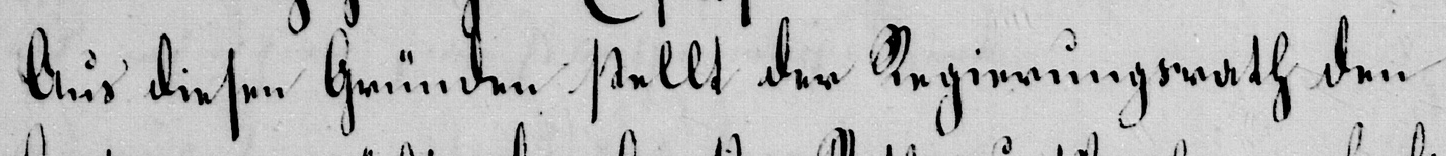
Aus diesen Gründen stellt der Regierungsrath den
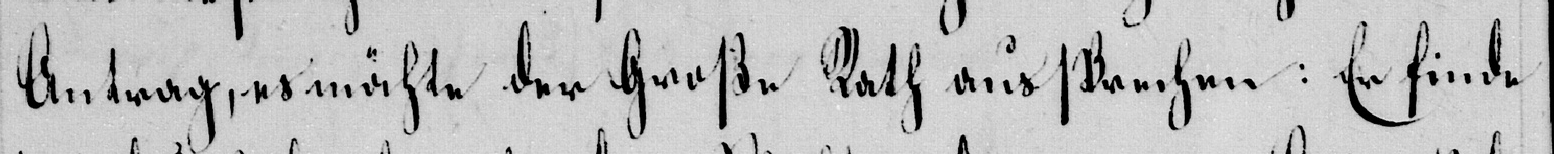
Antrag, es möchte der Große Rath aussprechen: Er finde
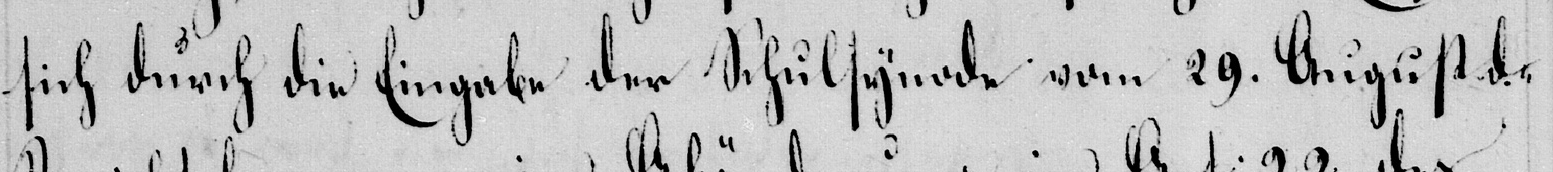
sich durch die Eingabe der Schulsynode vom 29. August d.
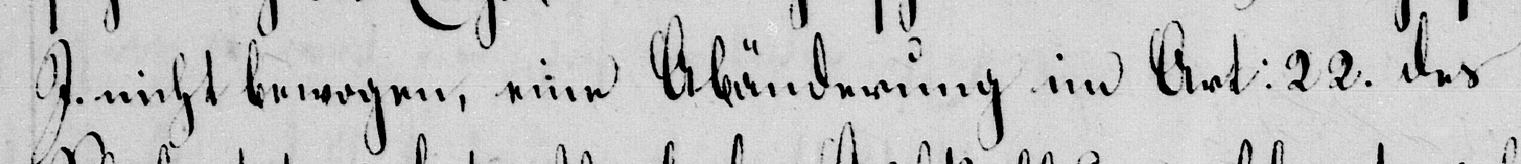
J. nicht bewogen, eine Abänderung im Art: 22. des
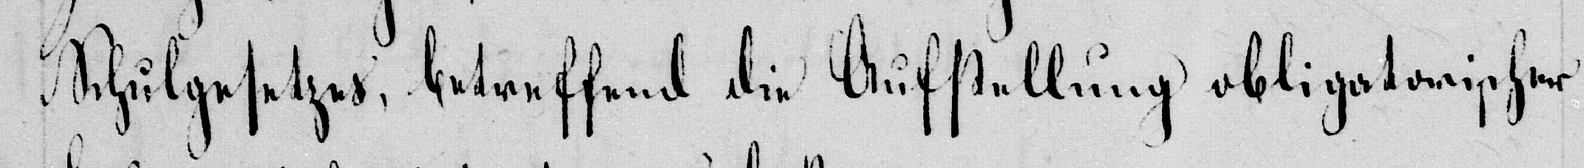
Schulgesetzes, betreffend die Aufstellung obligatorischer
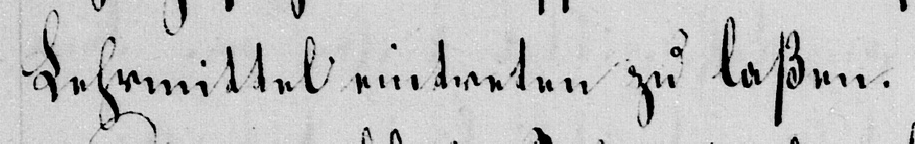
Lehrmittel eintreten zu laßen.
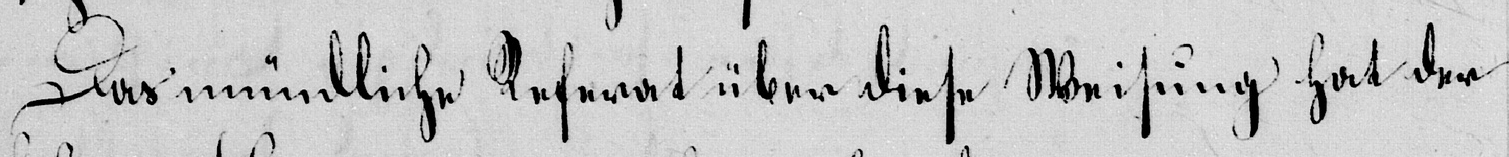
Das mündliche Referat über diese Weisung hat der
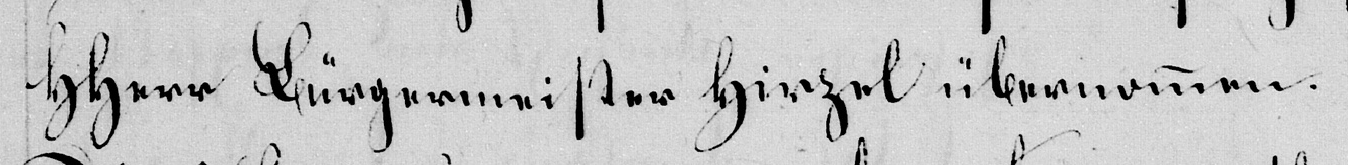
HHerr Bürgermeister Hirzel übernommen.
